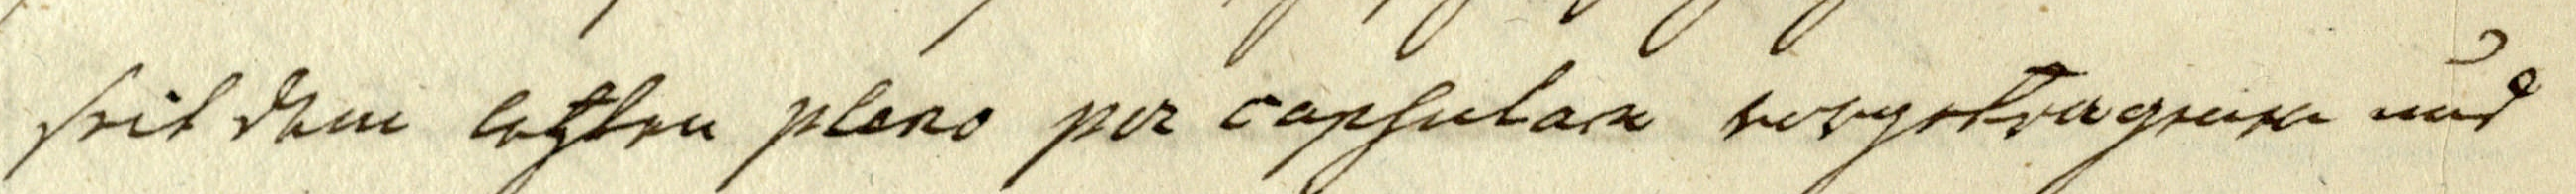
seit dem letzten pleno per capsulam vorgetragenen und
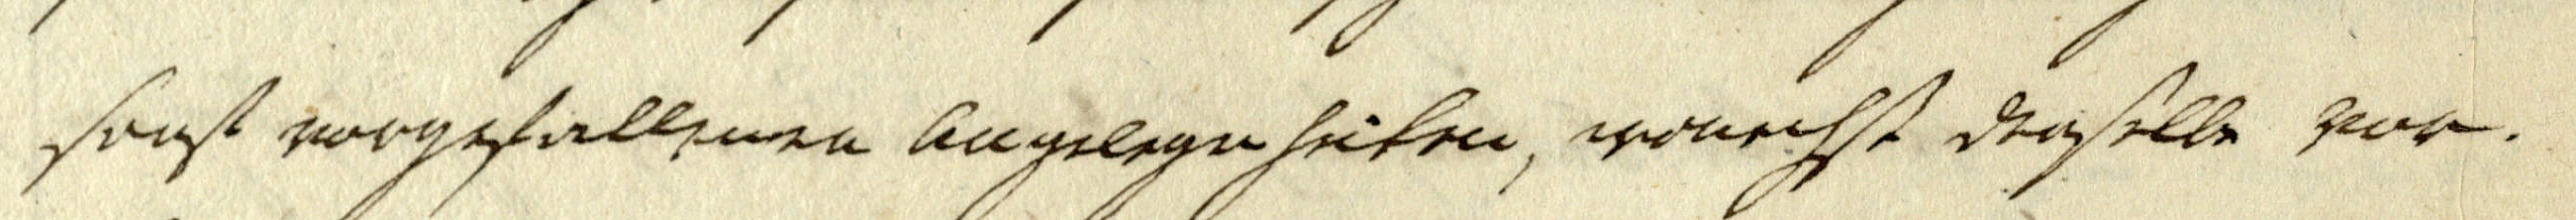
sonst vorgefallenen Angelegenheiten, wonechst derselbe vor¬
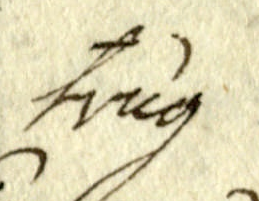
trug
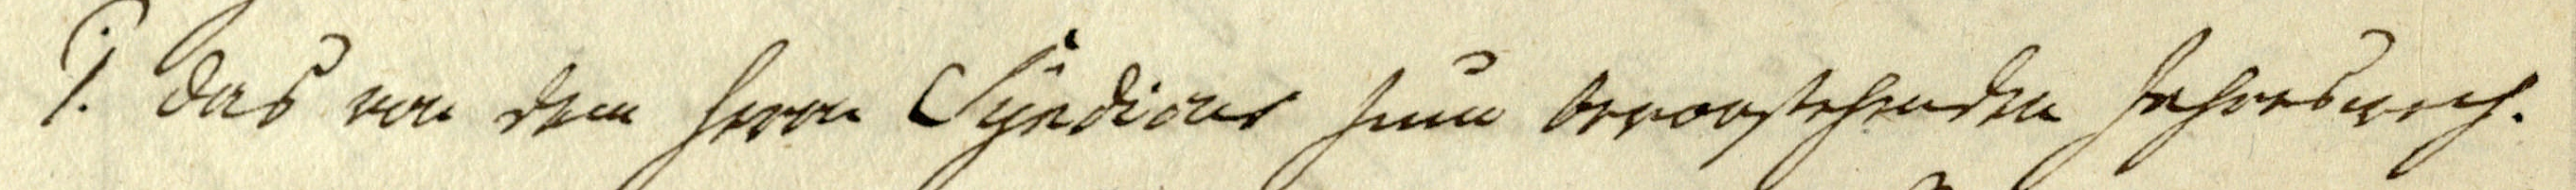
1. das von dem herrn Sÿndicus zum bevorstehenden Jahreswech¬
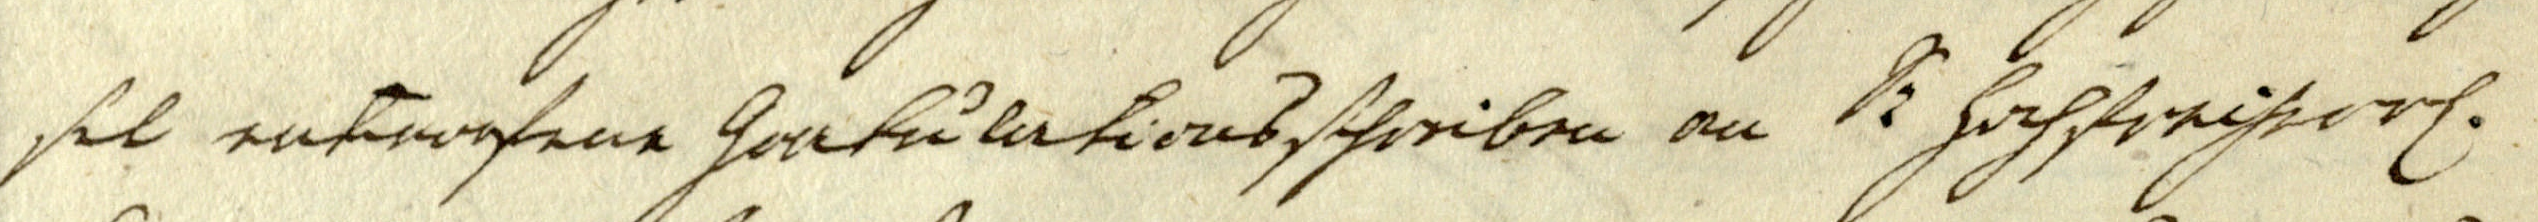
sel entworfene Gratulationsschreiben an Sr. Hochfreiherrl.
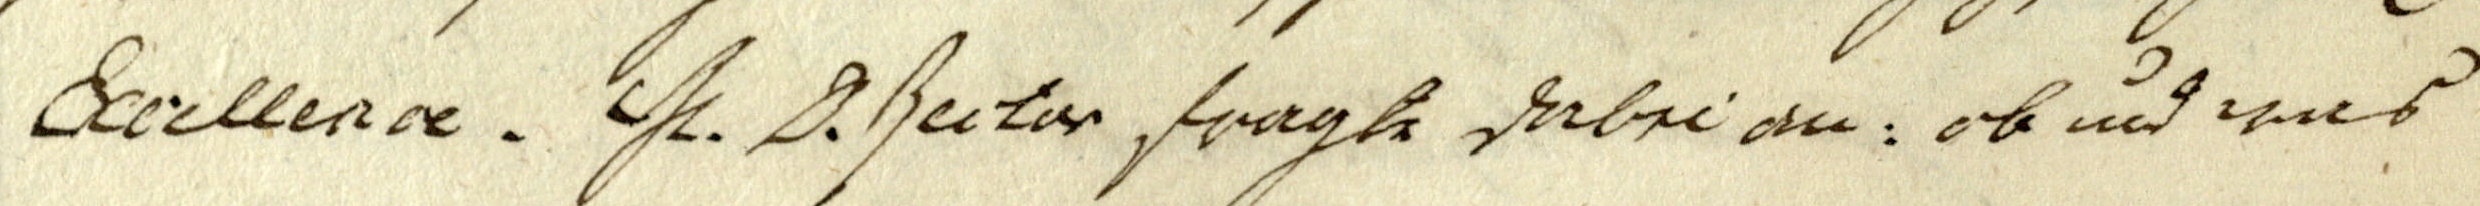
Excellence. M. D. Rector fragte dabei an: ob und was
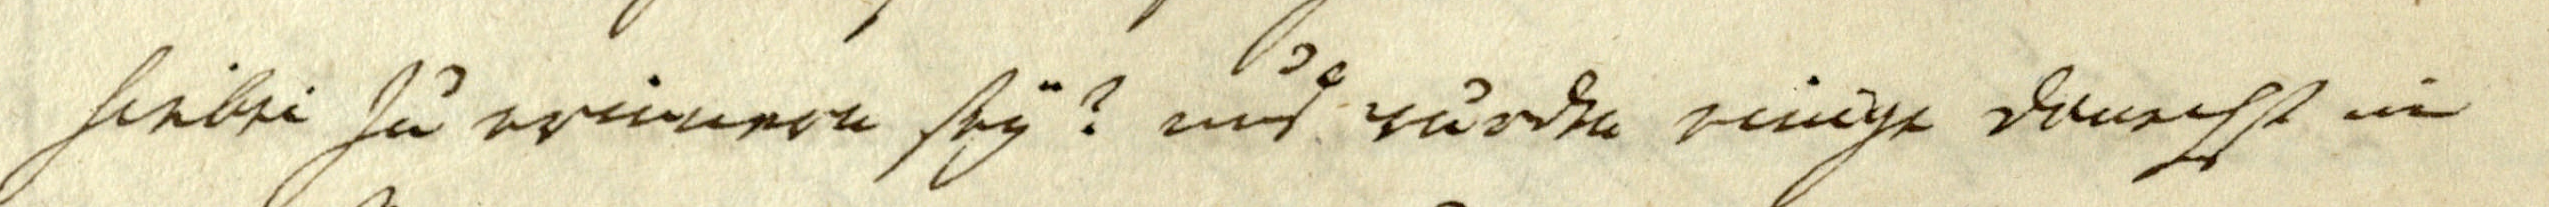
hiebei zu erinnern seÿ? und wurden einige danechst in
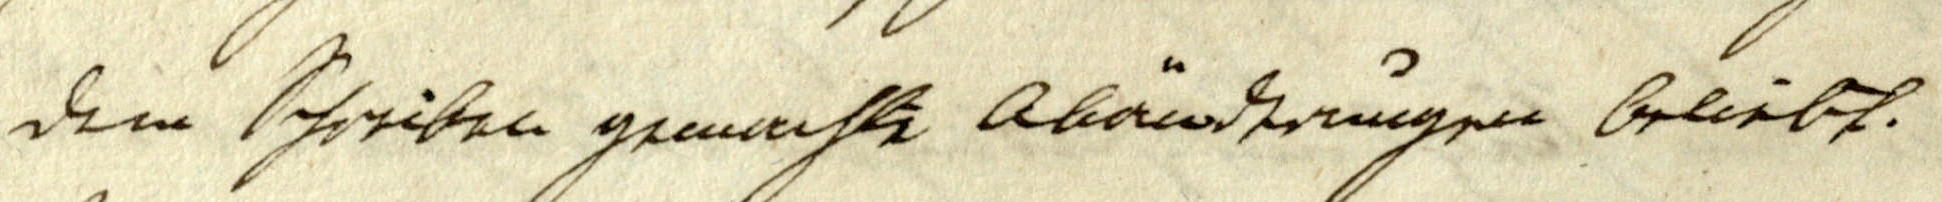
dem Schreiben gemachte Abänderungen beliebt.
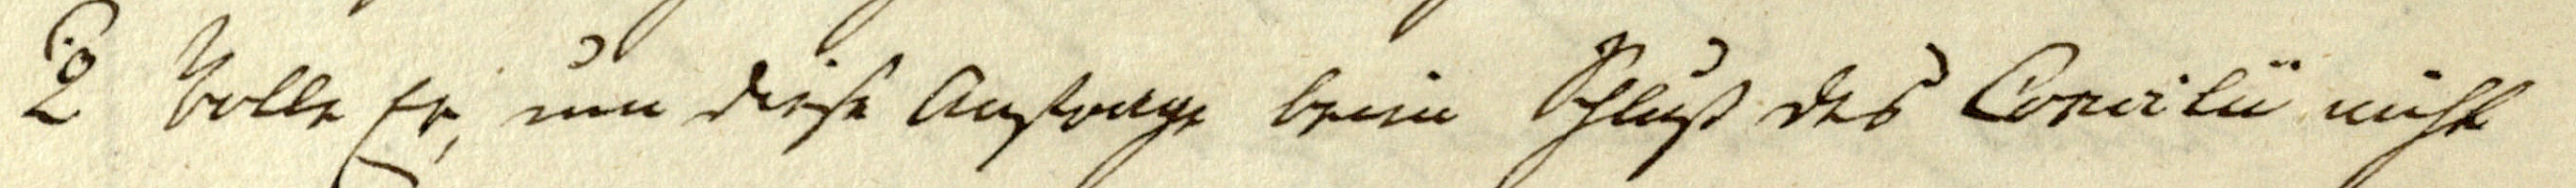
2. Wolle Er, um diese Anfrage beim Schluß des Concilii nicht
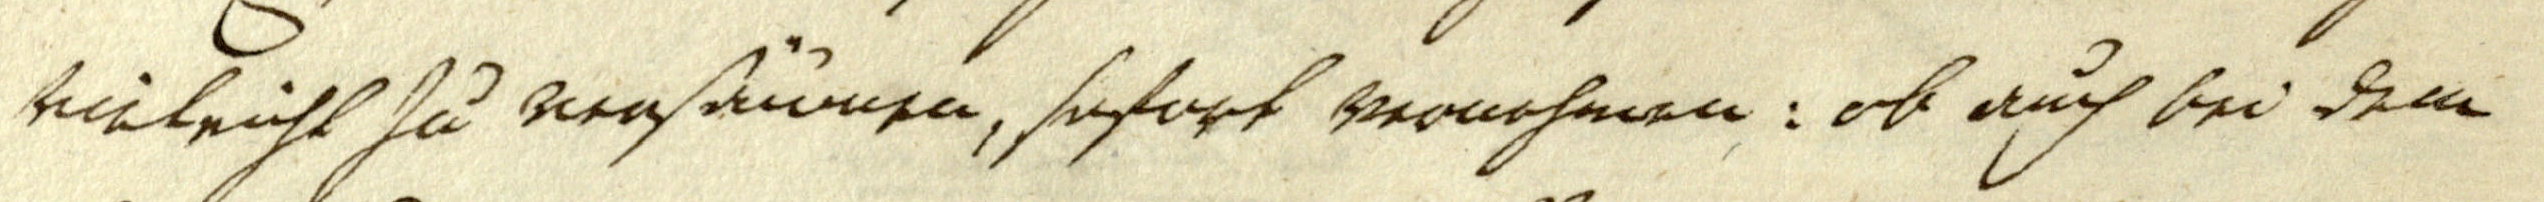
vielleicht zu versäumen, sofort vernehmen: ob auch bei dem
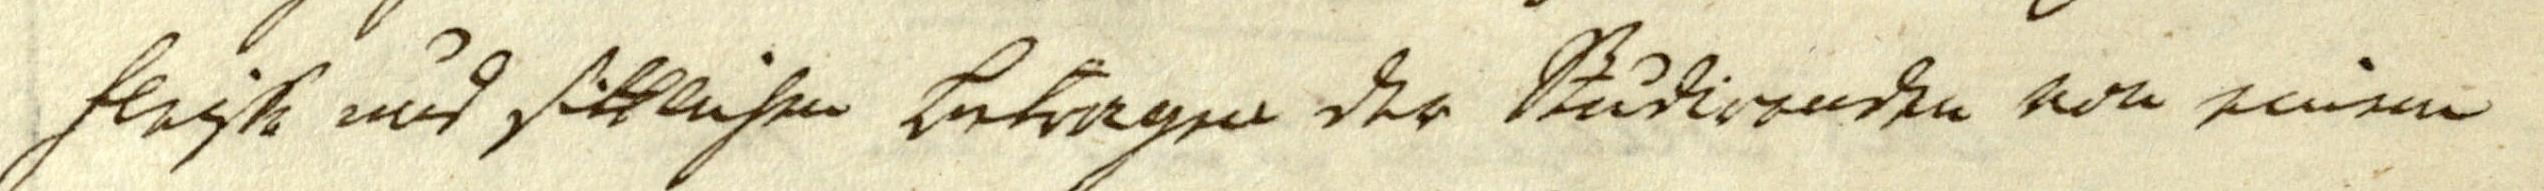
Fleiße und sittlichen Betragen der Studirenden von einem
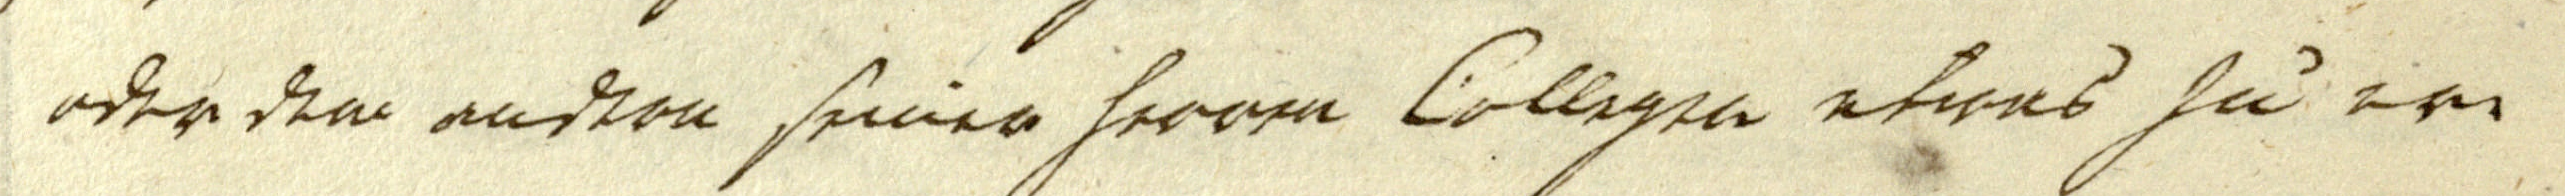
oder dem andern seiner herrn Collegen etwas zu er¬
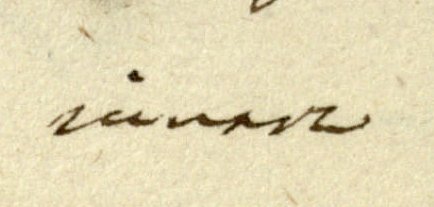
innern
